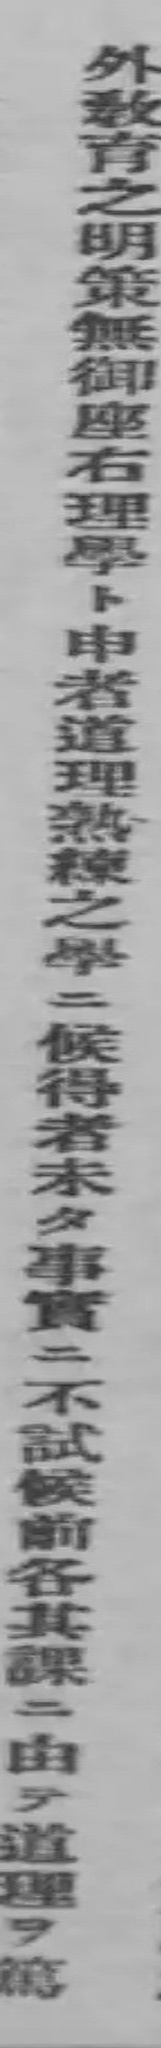外教育之明策無御座右理学ト申者道理熟練之学ニ候得者未タ事実ニ不試候前各其課ニ由テ道理ヲ篤
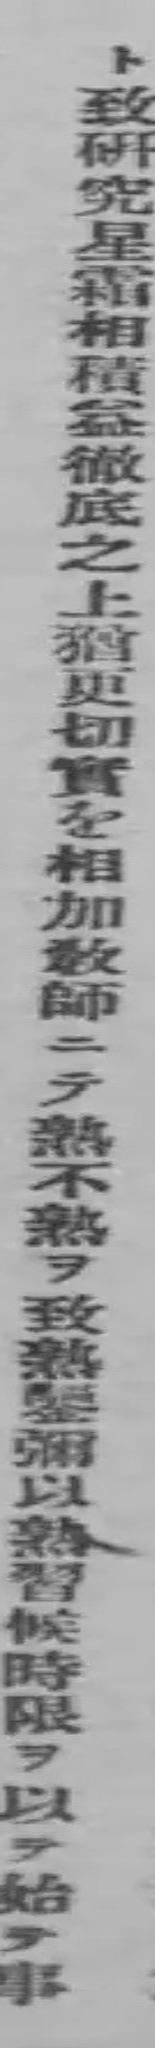ト致研究星霜積益徹底之上猶更切実を相加教師ニテ熟不熟ヲ致熟鏧弥以熟習候時限ヲ以テ始テ事
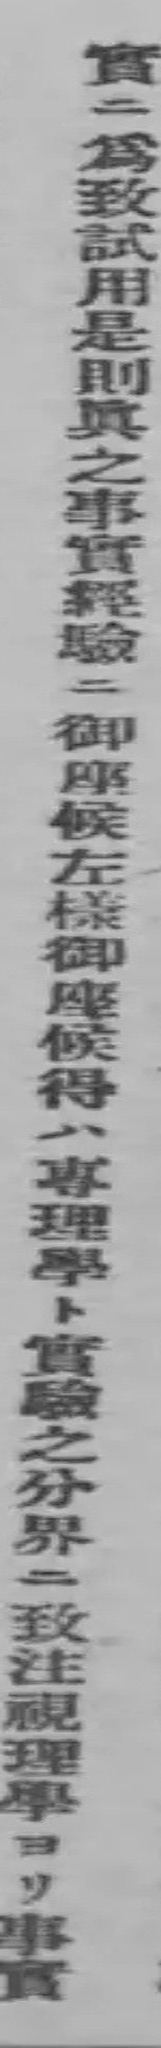実ニ為致試用是則真之事実経験ニ御座候左様御座候得ハ専理学ト実験之分界ニ致注視理学ヨリ事実
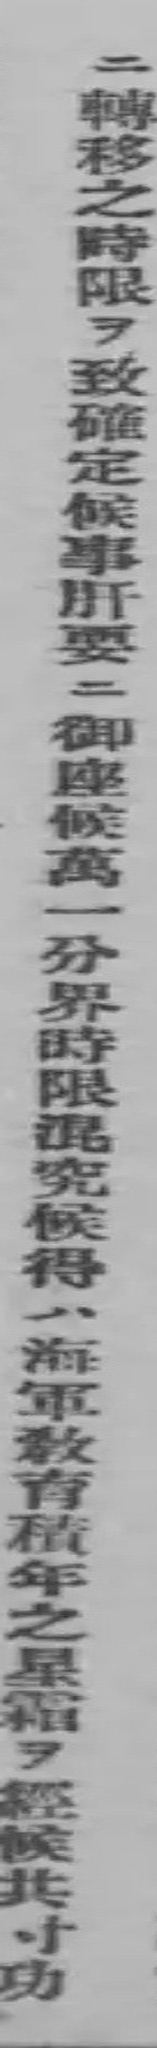ニ転移之時限ヲ致確定候事肝要ニ御座候万一分界時限混究候得ハ海軍教育積年之星霜ヲ経候共寸功
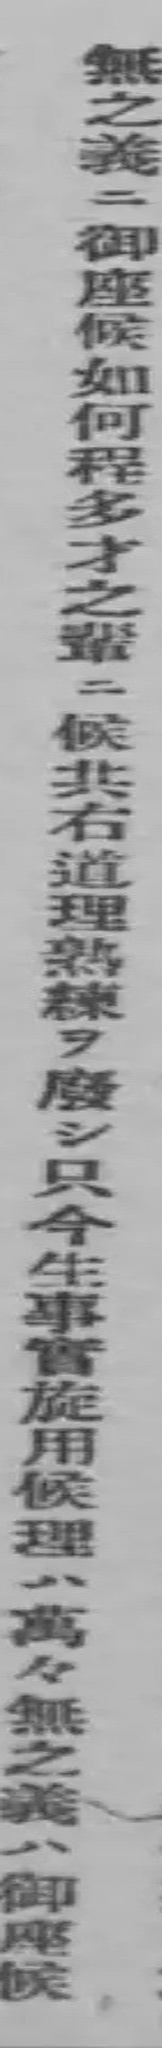無之義ニ御座候如何程多才之輩ニ候共右道理熟練ヲ廃シ只今生事実旋用候理ハ万々無之義ハ御座候
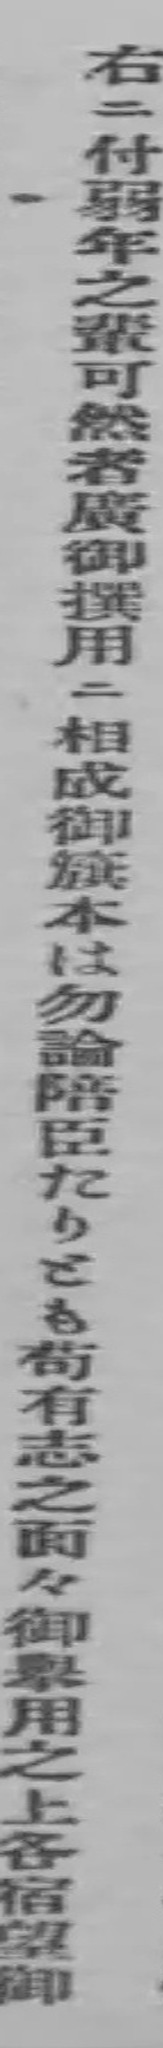右ニ付弱年之輩可然者広御撰用ニ相成御籏本は勿論陪臣たりとも苟有志之面々御挙用之上各宿望御
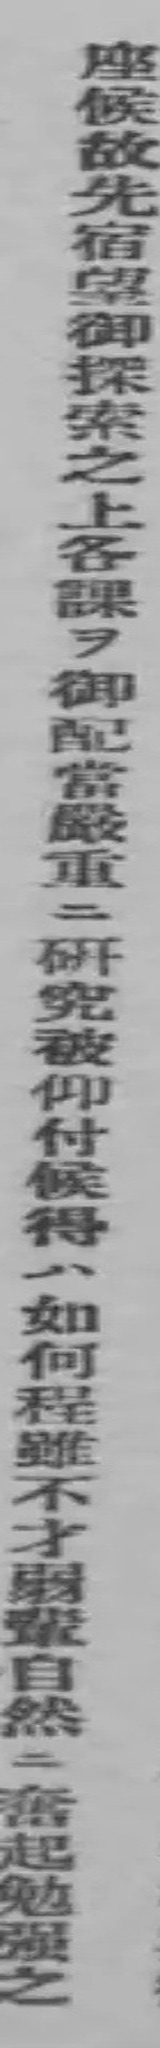座候故先宿望御探索之上各課ヲ御配当厳重ニ研究被仰付候得ハ如何程雖不才弱輩自然ニ奮起勉強之
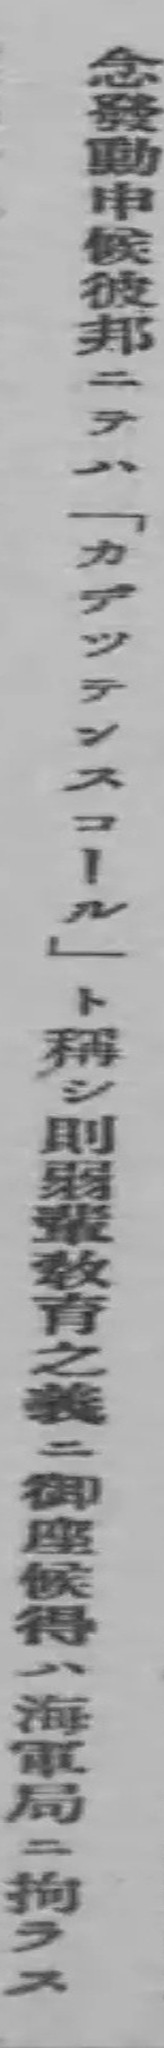念発動申候彼邦ニテハ「カデツテンスコール」ト称シ則弱輩教育之義ニ御座候得ハ海軍局ニ拘ラス
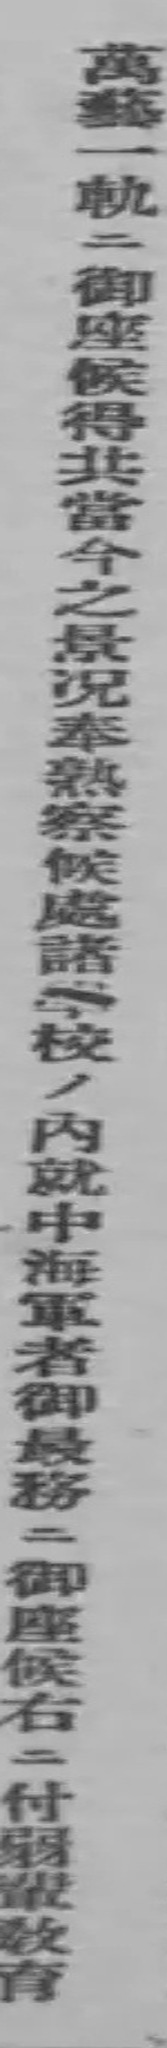万芸一軌ニ御座候得共当今之景況奉熟察候処諸学校ノ内就中海軍者御最務ニ御座候右ニ付弱輩教育
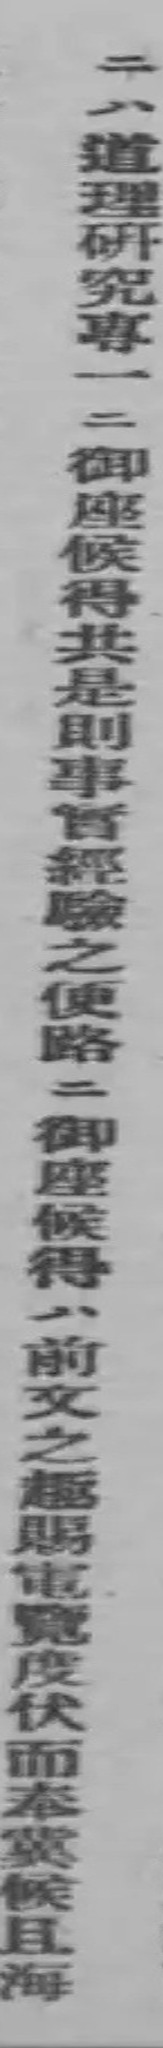ニハ道理研究専一ニ御座候得共是則事実経験之便路ニ御座候得ハ前文之趣賜電覧度伏而奉冀候且海
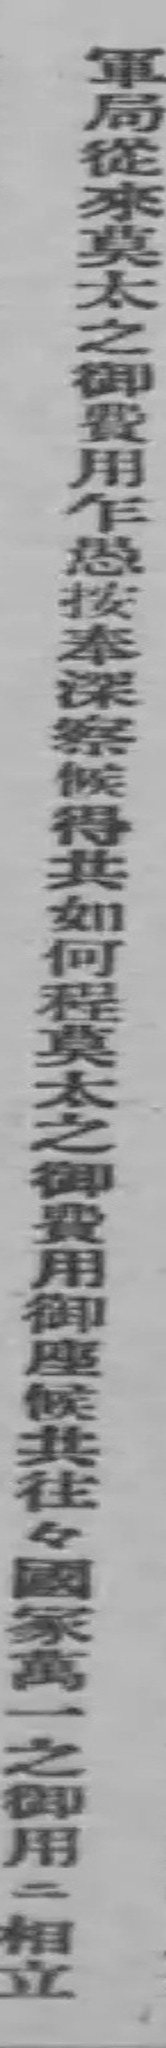軍局従来莫太之御費用乍愚按奉深察候得共如何程莫太之御費用御座候共往々国家万一之御用ニ相立
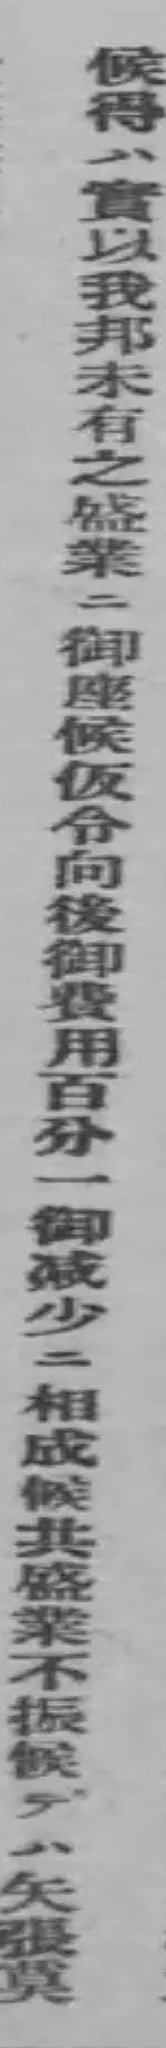候得ハ実以我邦未有之盛業ニ御座候仮令向後御費用百分一御減少ニ相成候共盛業不振候テハ矢張莫
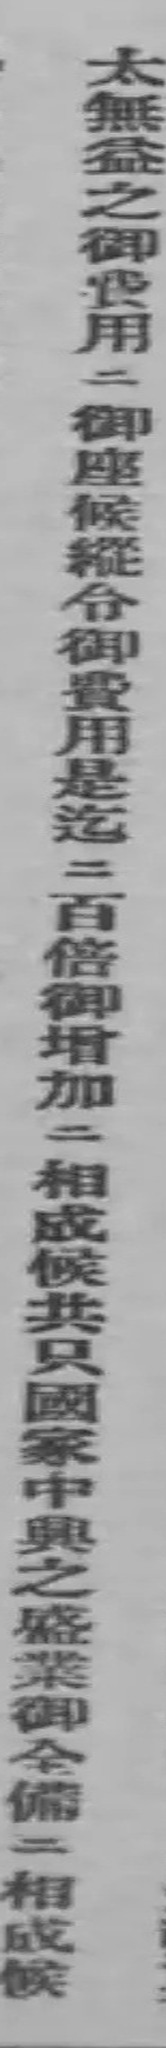太無益之御費用ニ御座候縦令御費用是迄ニ百倍御増加ニ相成候共只国家中興之盛業御全備ニ相成候
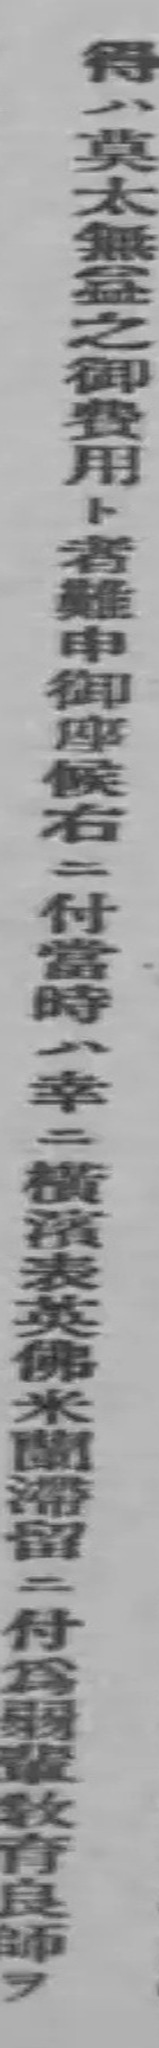得ハ莫太無益之御費用ト者難申御座候右ニ付当時ハ幸ニ横浜表英仏米蘭滞留ニ付為弱輩教育良師ヲ
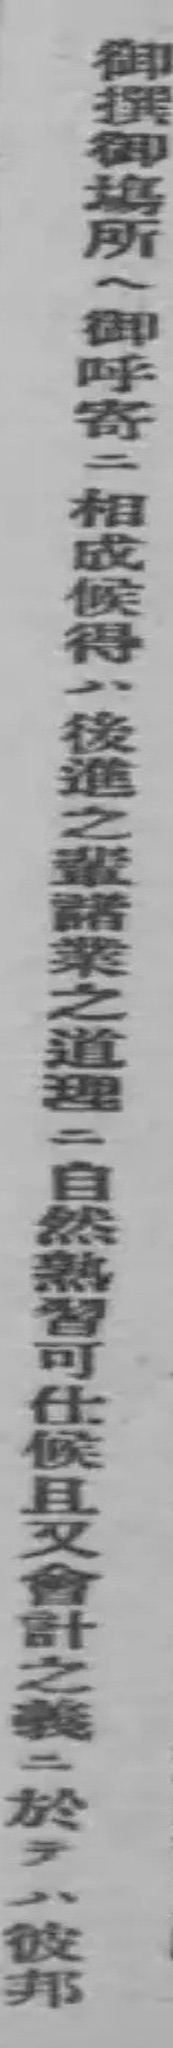御撰御場所へ御呼寄ニ相成候得ハ後進之輩諸業之道理ニ自然熟習可仕候且又会計之義ニ於テハ彼邦
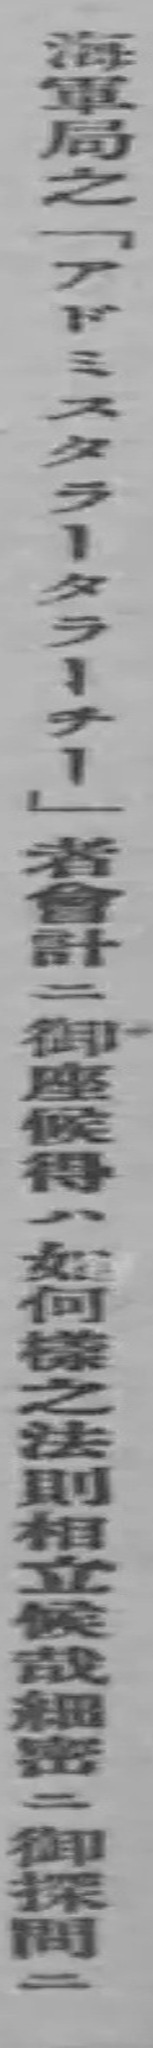海軍局之「アドミスタラータラーチー」者会計ニ御座候得ハ如何様之法則相立候哉細密ニ御探問ニ
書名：豊橋市史談
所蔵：国立国会図書館 National Diet Library, JAPAN
